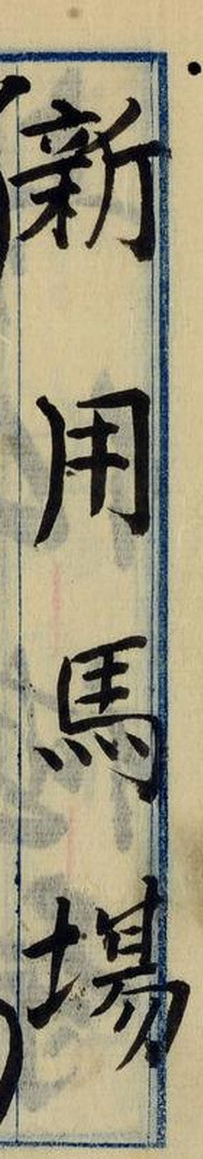新用馬場
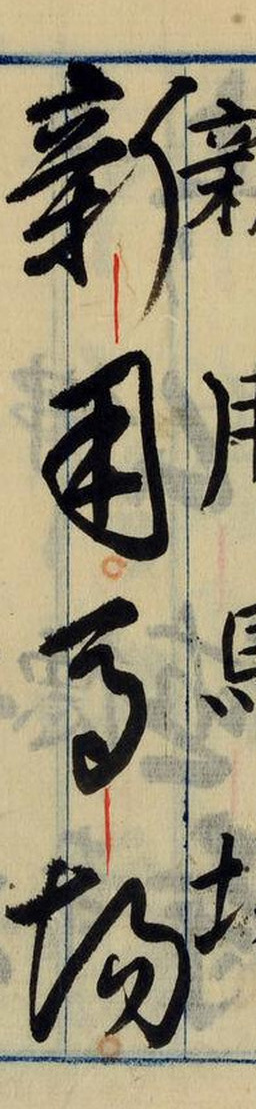新用馬場
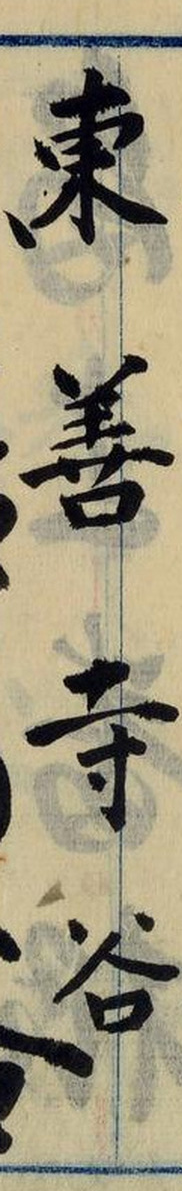東善寺谷
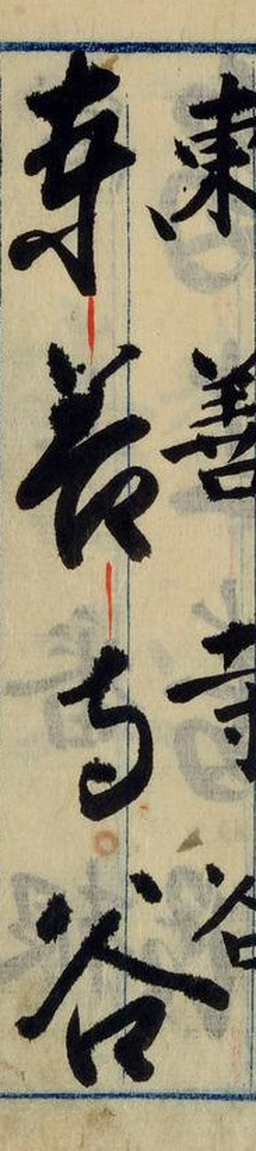東善寺谷

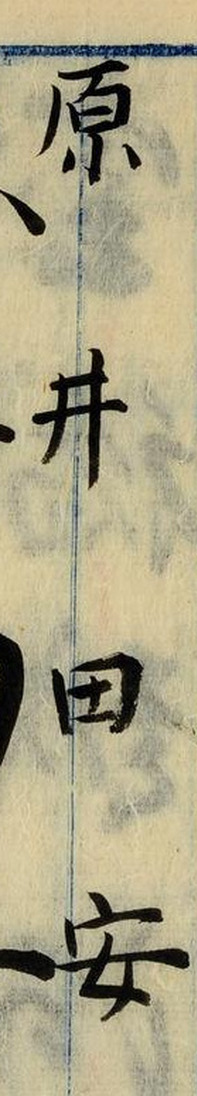原井田安
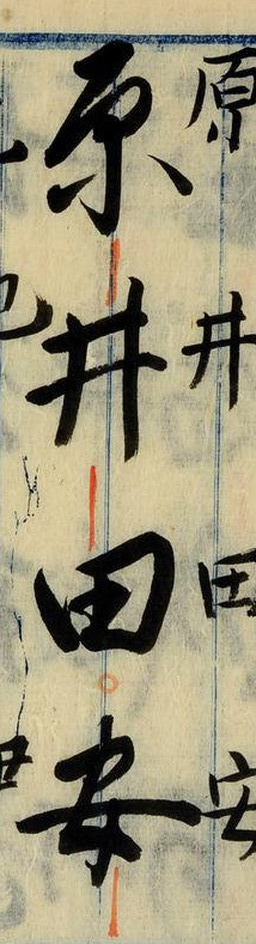原井田安
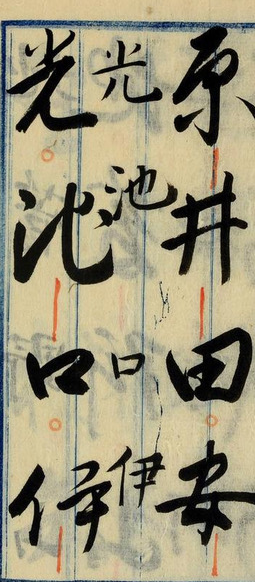光池口伊
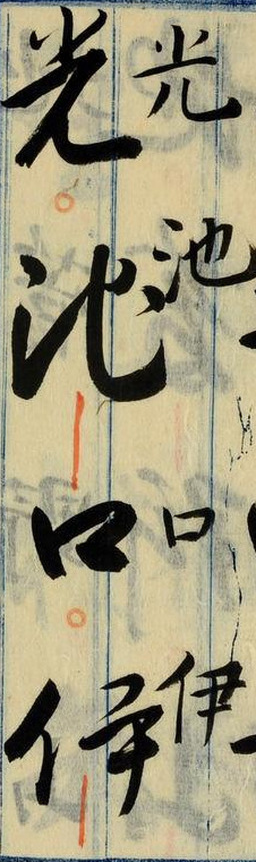光池口伊
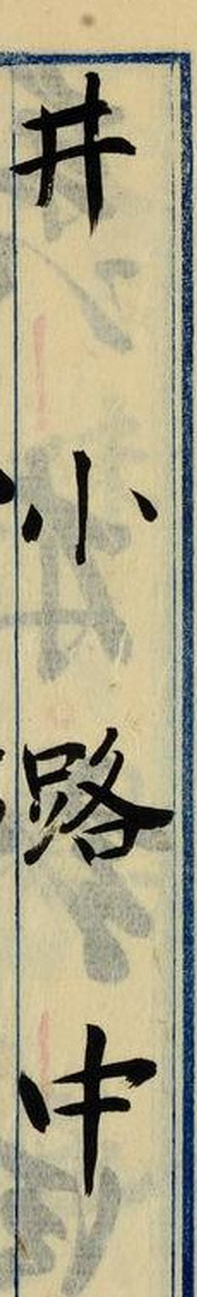井小路中
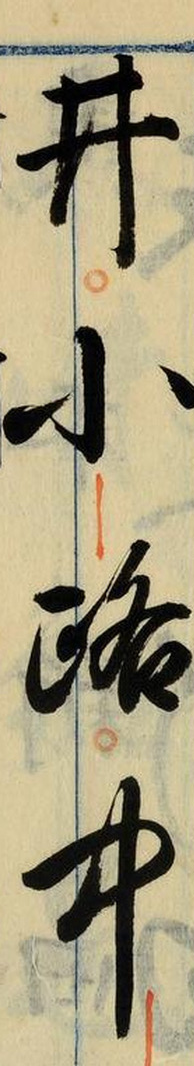井小路中
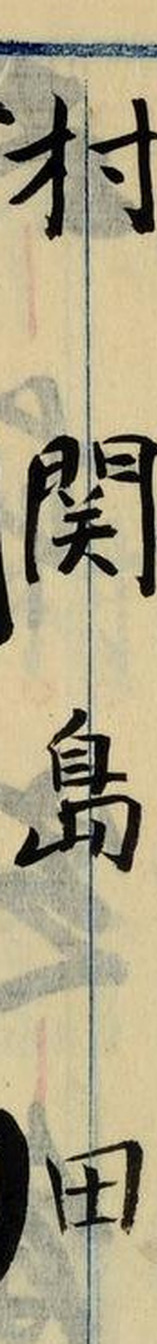村関島田
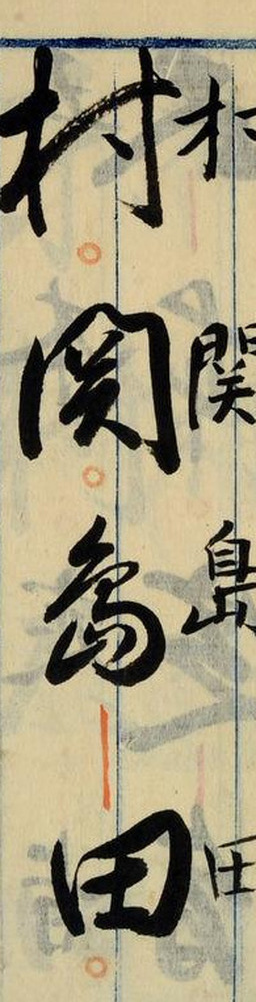村関島田

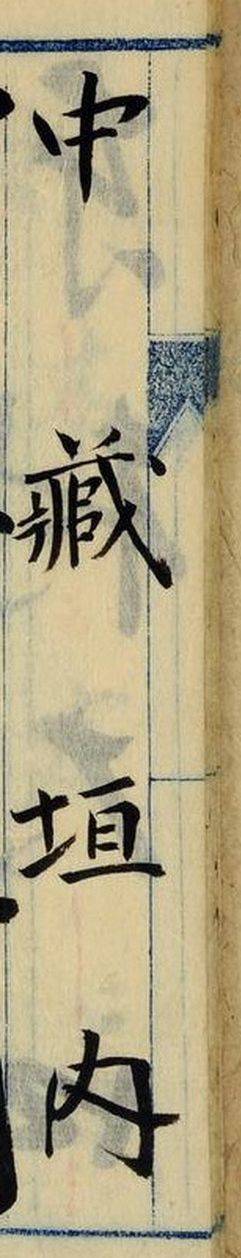中藏垣内
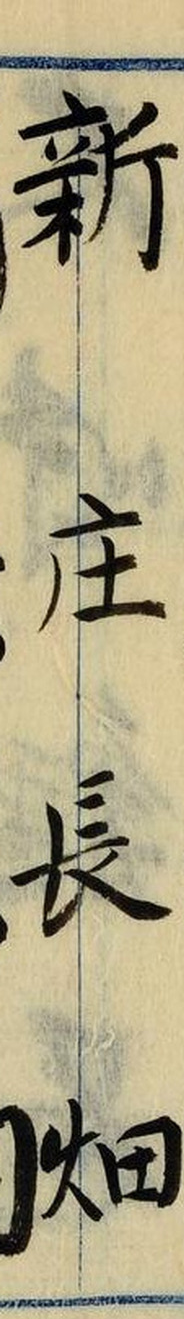新庄長畑
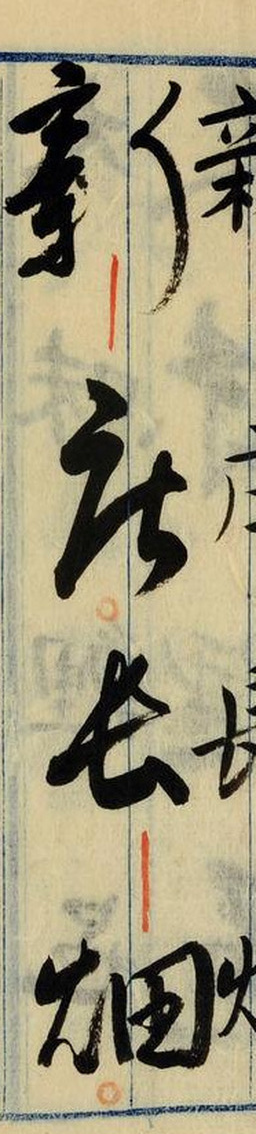新庄長畑
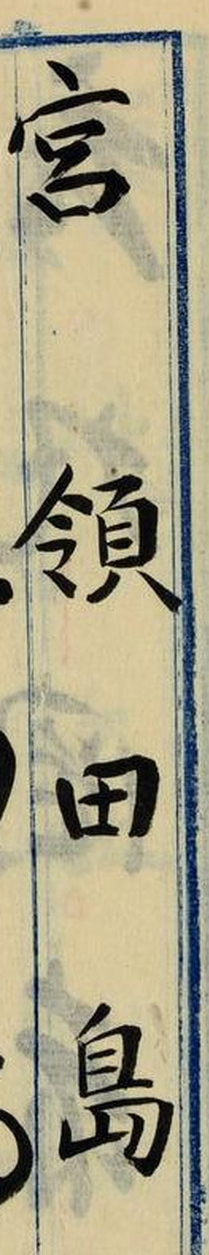宮領田島
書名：村名・連語
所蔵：福井県文書館 Fukui Prefectural Archives
